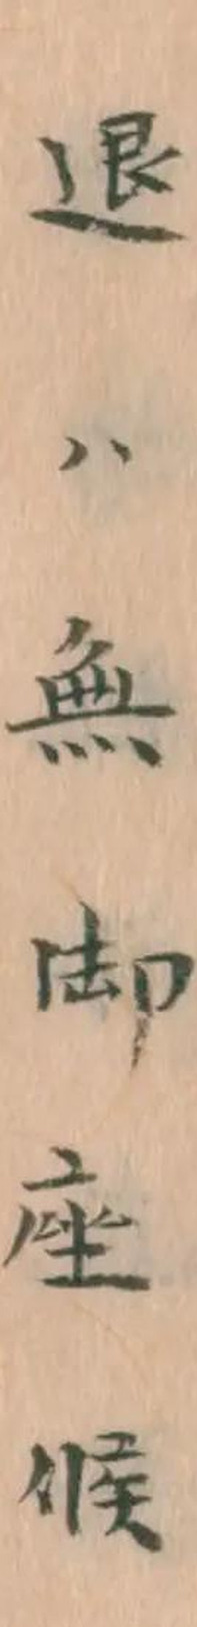退二無御座候
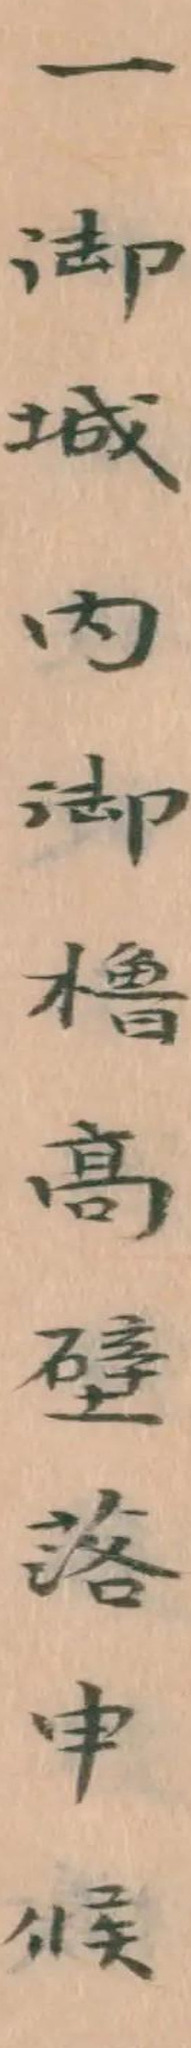一御城内御櫓高壁落申候
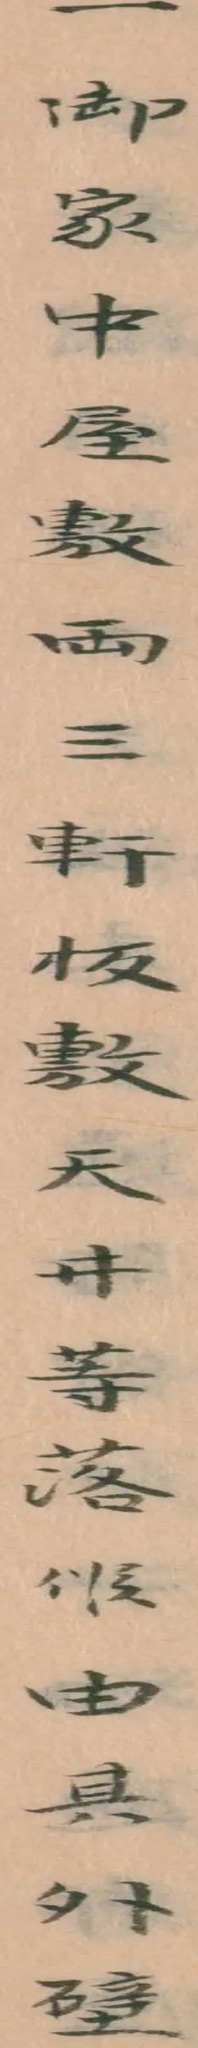一御家中屋敷両三軒板敷天井等落候由其外壁
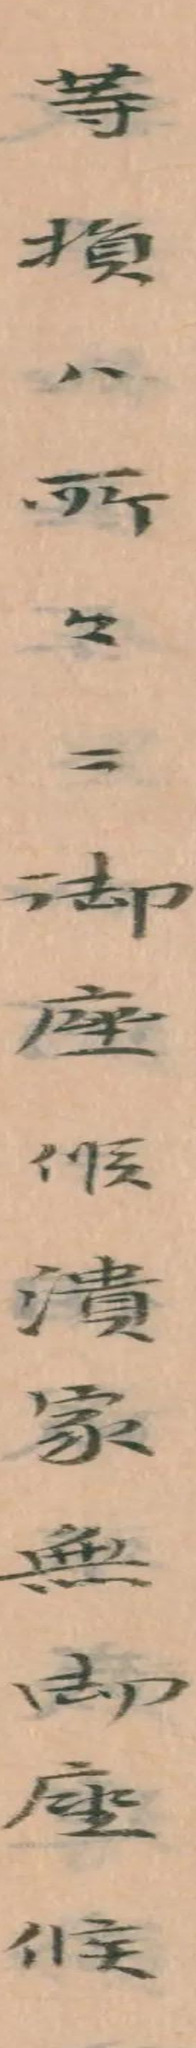等損ハ所々二御座候潰家無御座候
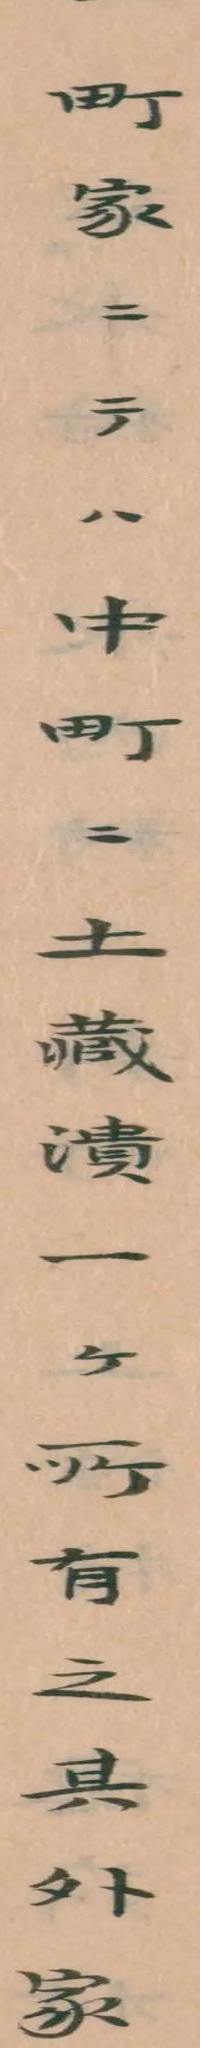一町家二テハ中町二土蔵潰一ヶ所有之其外家
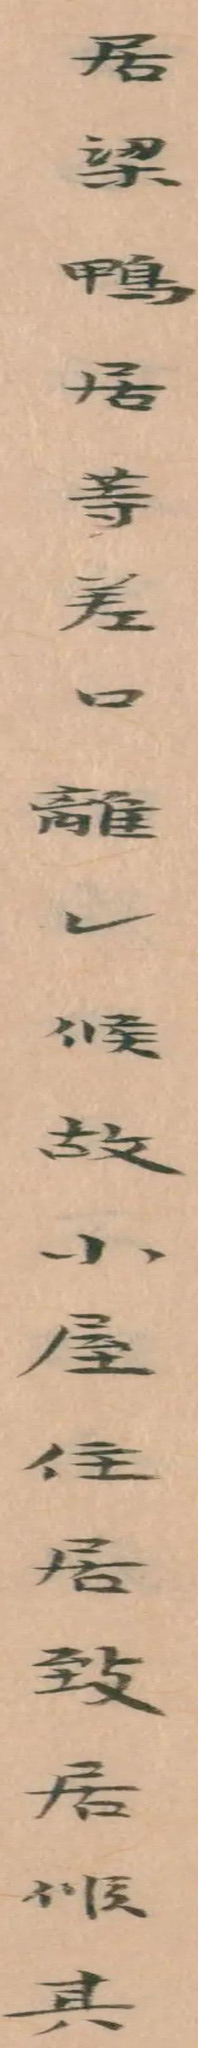居梁鴨居等差口離レ候故小屋住居致居候其
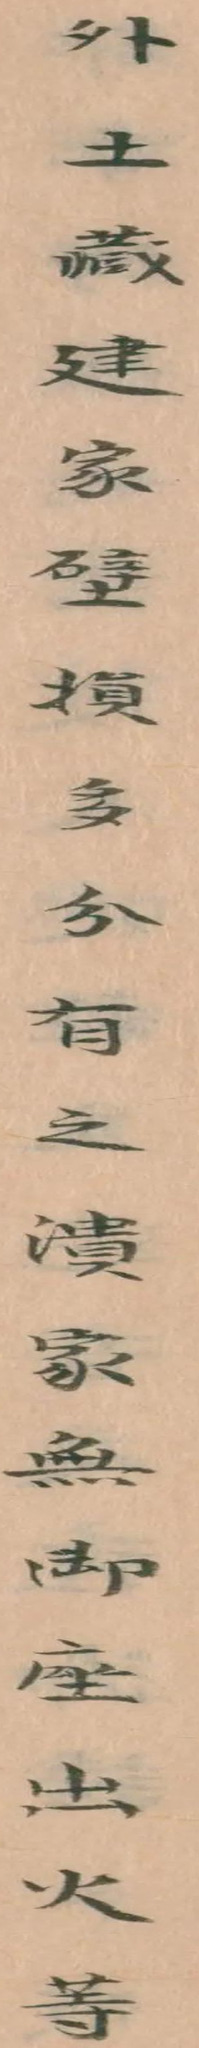外土蔵建家壁損多分有之潰家無御座出火等
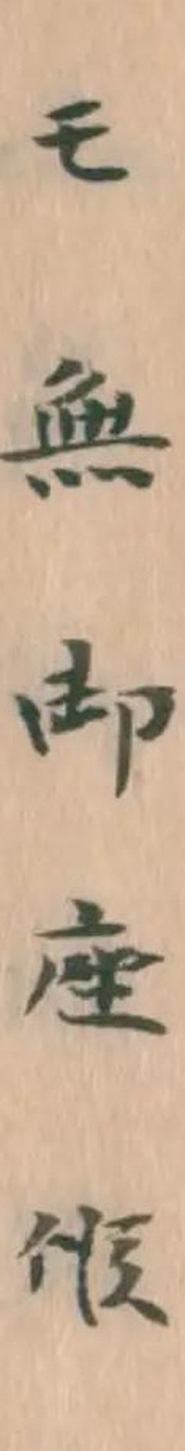モ無御座候
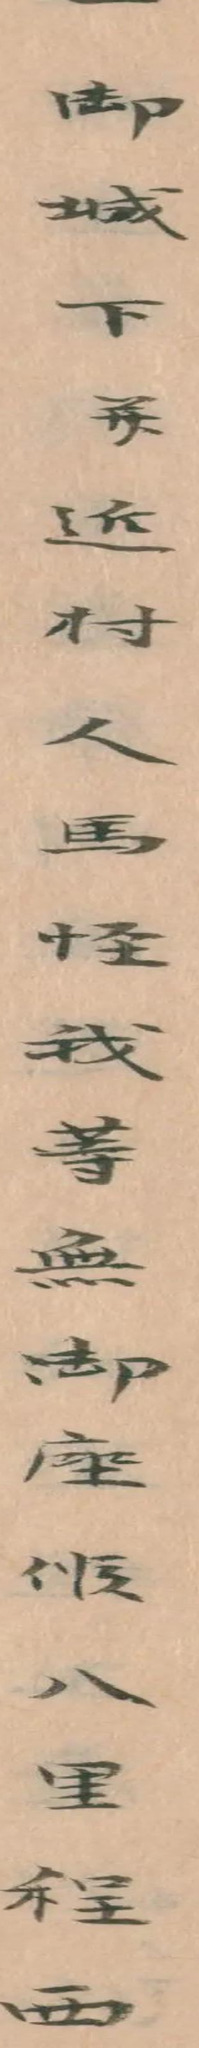一御城下并近村人馬怪我等無御座候八里程西
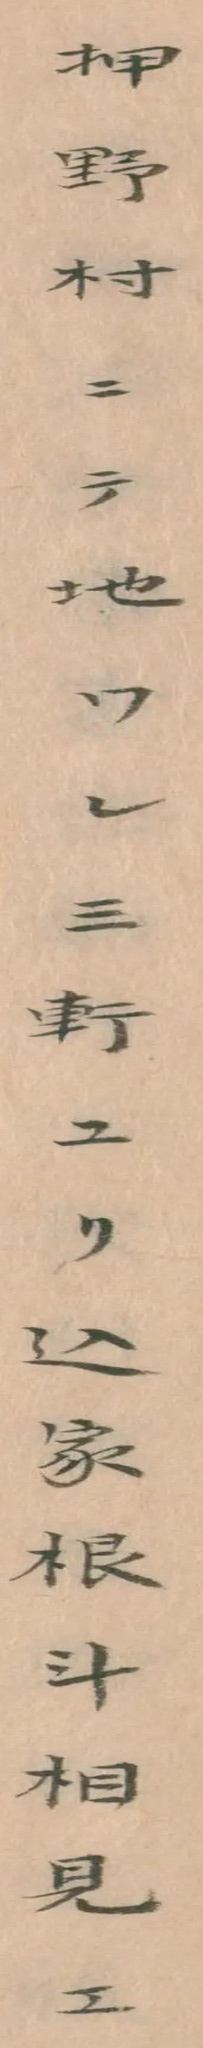押野村ニテ地ワレ三軒ユリ込家根斗相見エ
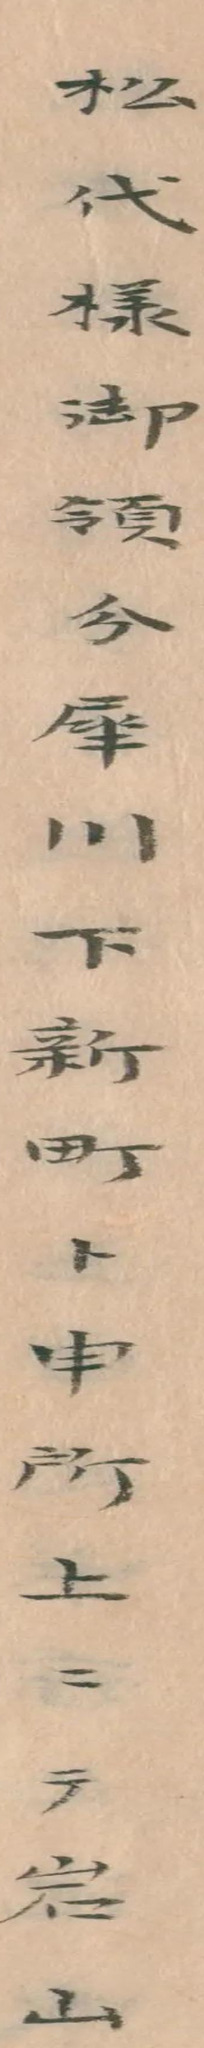一松代様御領分犀川下新町ト申所上ニテ岩山
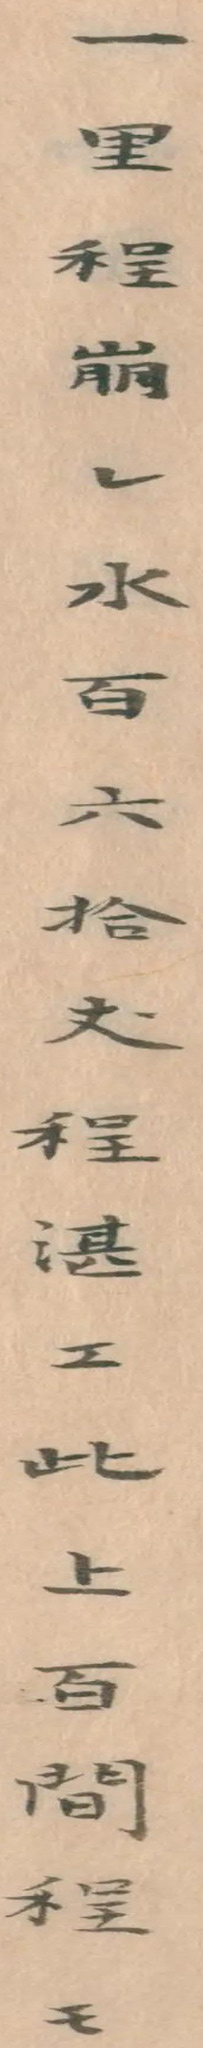一里程崩レ水百六拾丈程湛エ此上百間程モ
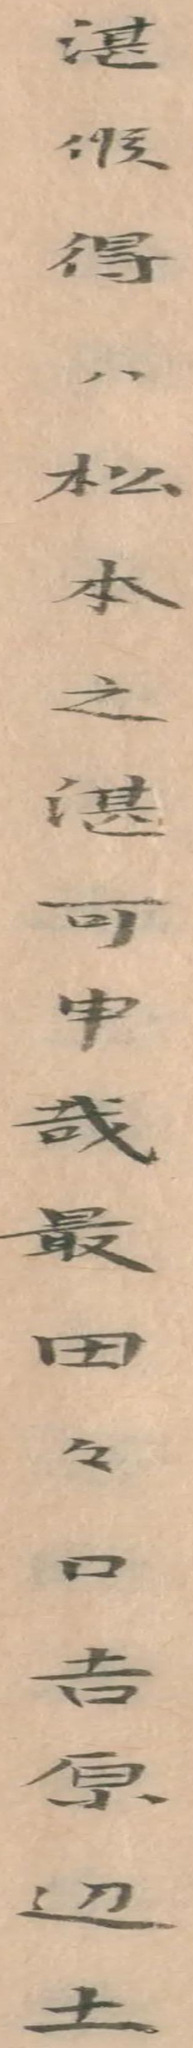湛候得ハ松本之湛可申哉最田々口吉原辺土

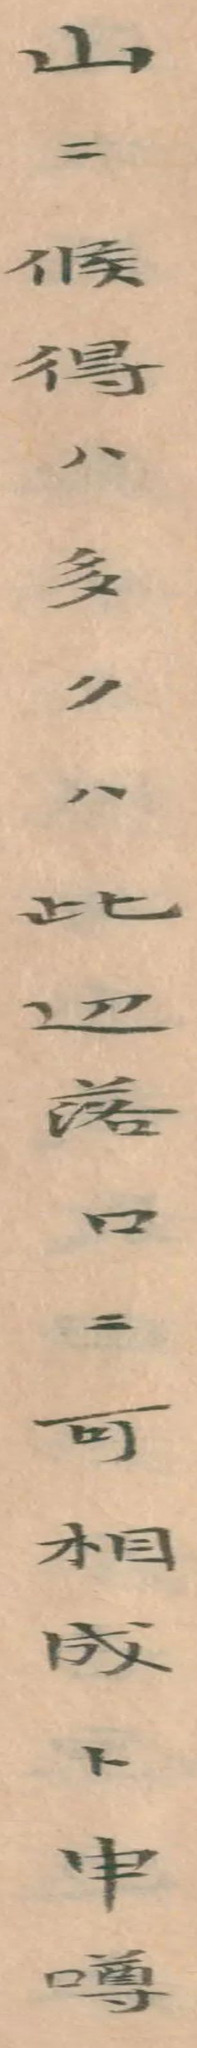山二候得ハ多クハ此辺落口二可相成ト申噂
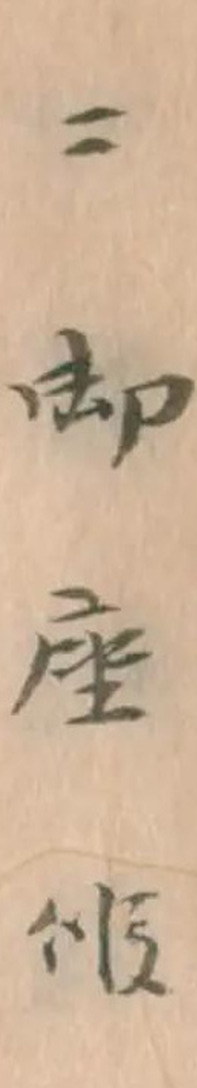二御座候
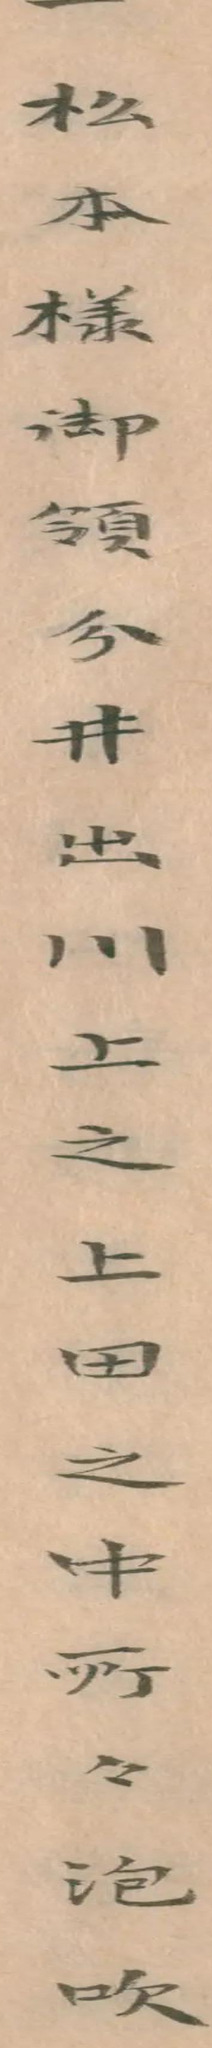一松本様御領分井出川上之上田之中所々泡吹
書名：地災撮要. 巻1(噴火山・地震ノ部)
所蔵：国立国会図書館 National Diet Library, JAPAN
